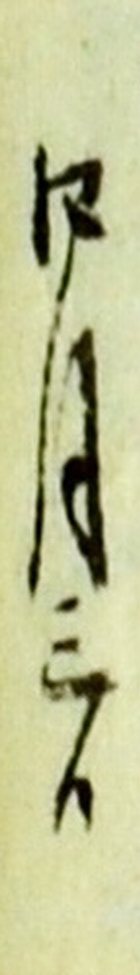四月三日
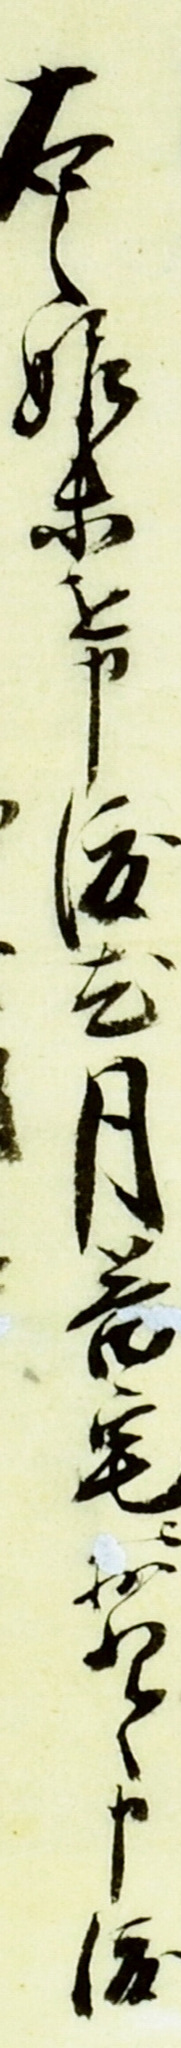右之始末を申渡尤月番宅ニおゐて申渡
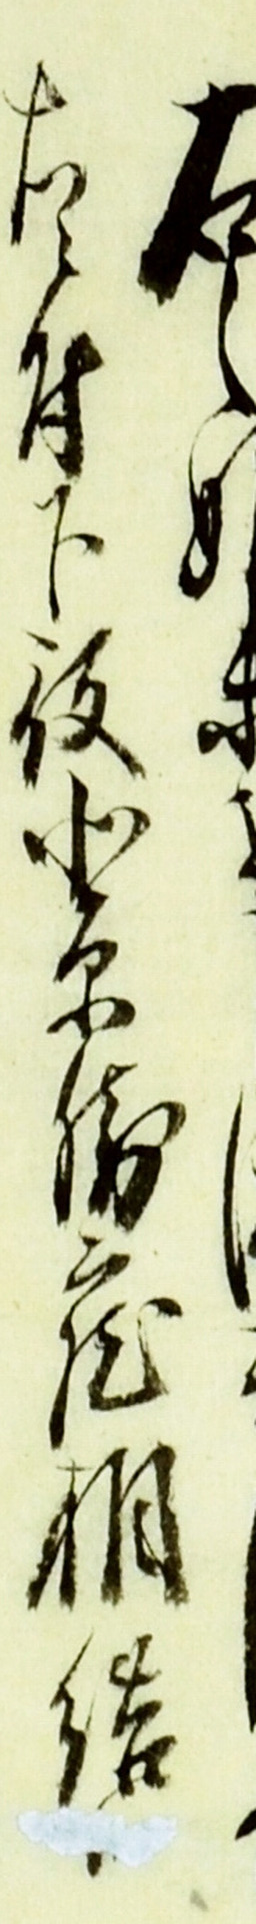右ニ付下役北原勝蔵相詰候
